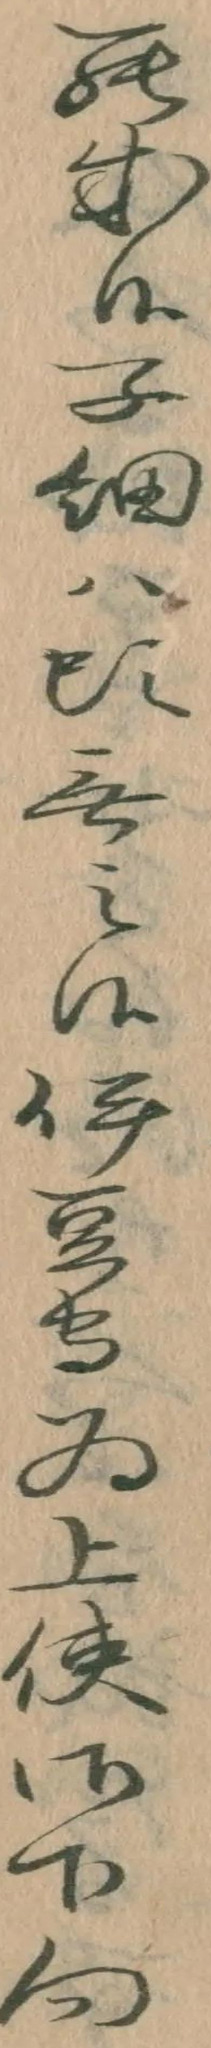罷成候子細は頭無之候伊豆守ゐ上使御下向
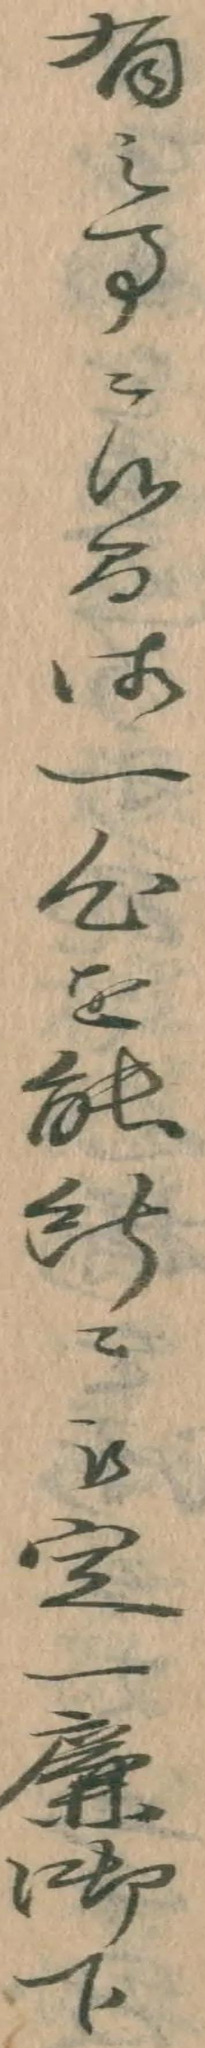有之事に候間御一心を能新に被定一廉御下
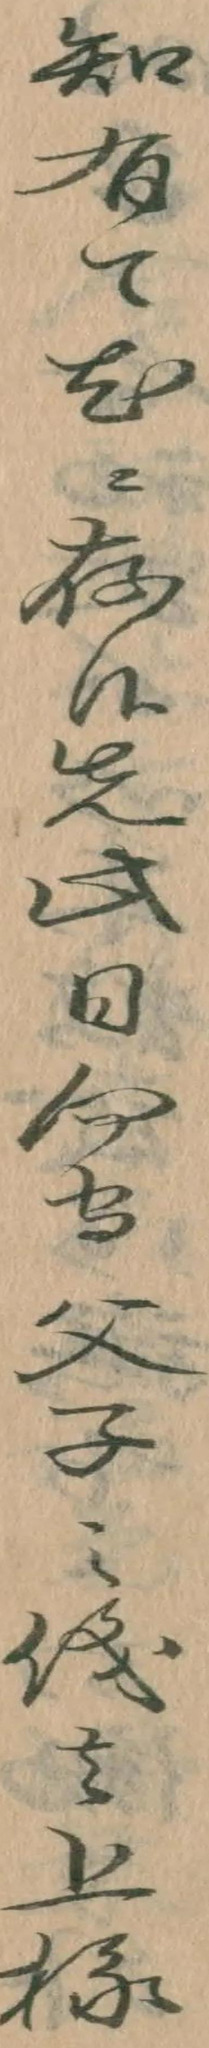知有て尤に存候先此日向守父子之儀者上様
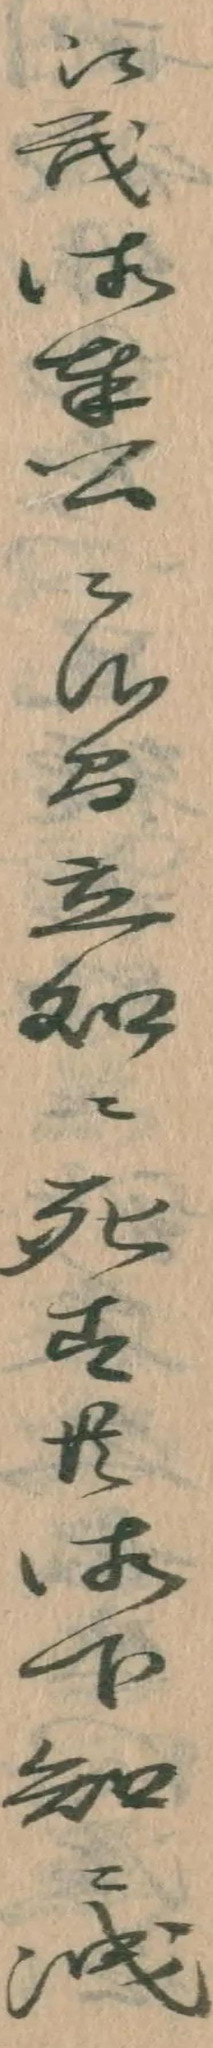江茂御奉公に候間立処に死春共御下知に洩
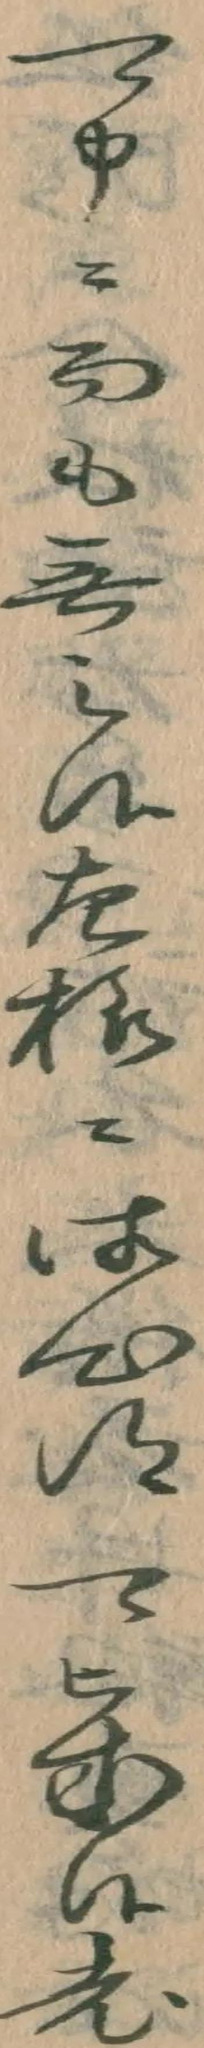可申に而も無之候左様に御心得可被成候老
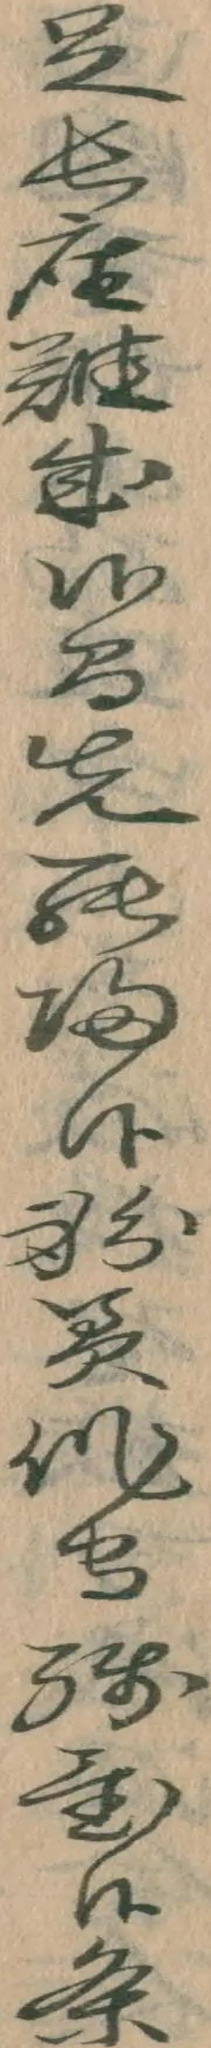足長座難成候間先罷帰候躮美作守残置候条
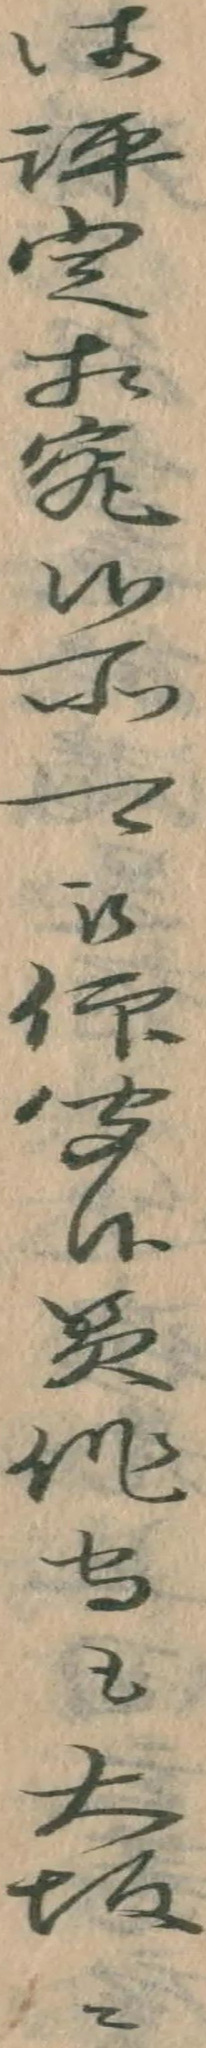御評定相究候所可被仰聞候美作守も大坂に
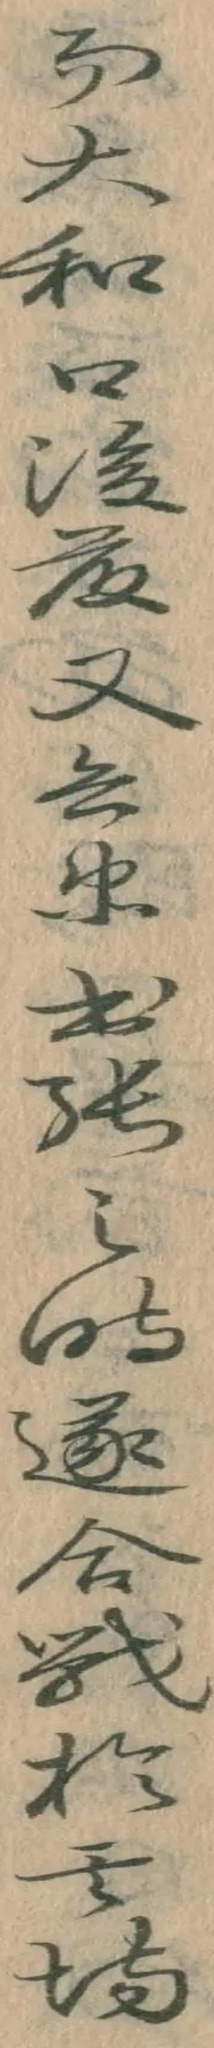而大和口後藤又兵衛出張之時遂合戦於其場
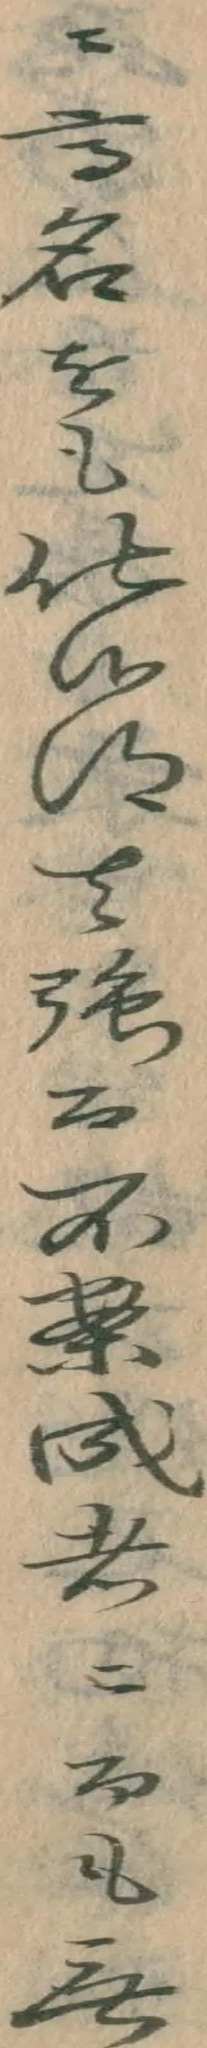に高名をも仕候得者強而不案成者に而も無
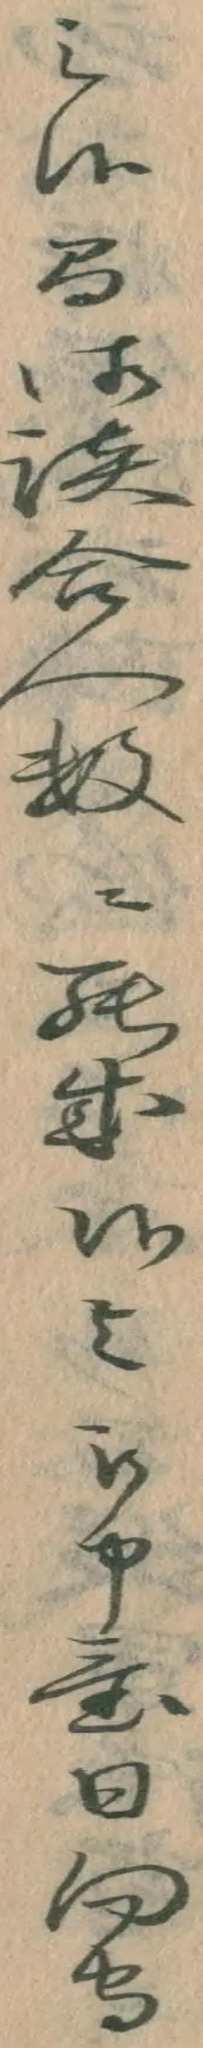之候間御談合人数に罷成候与被申置日向守
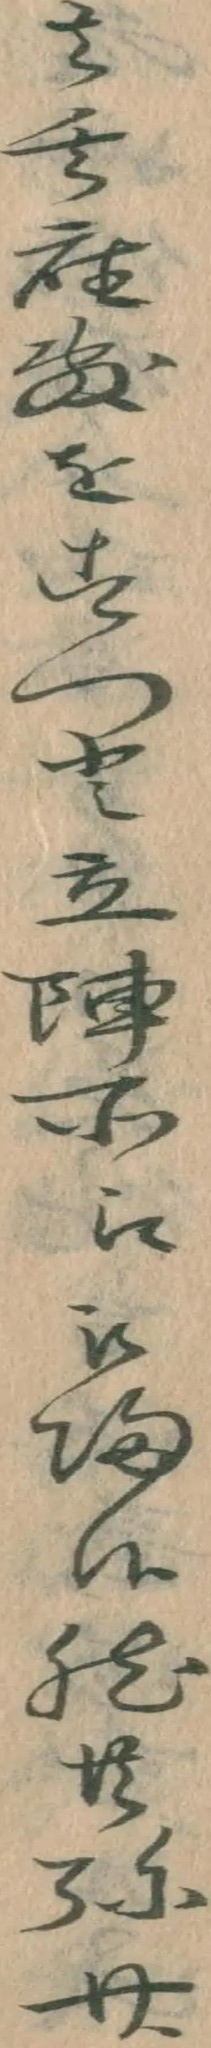者其座敷を春つ登立陣所江被帰候然共弥廿
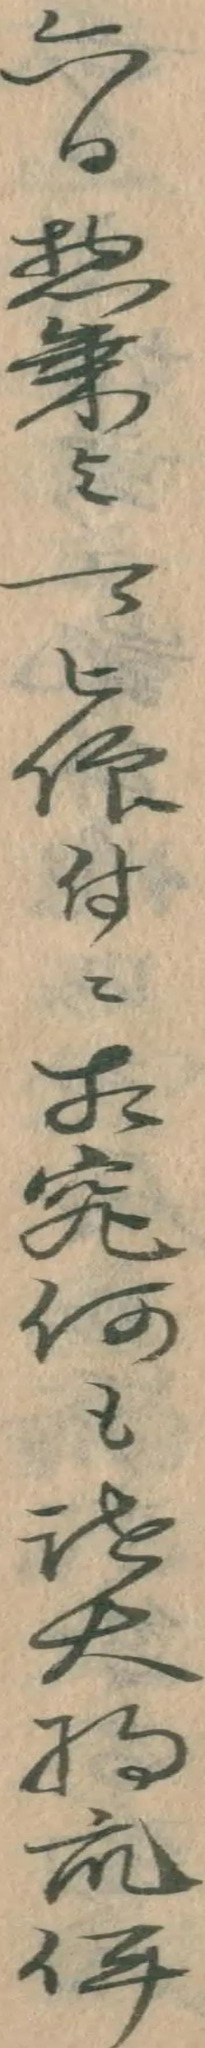六日惣乗与可被仰付に相究何も諸大将衆伊
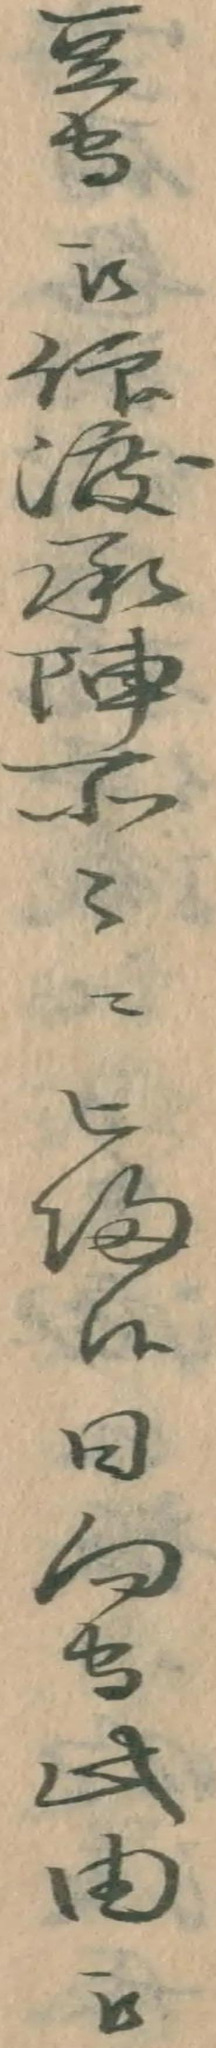豆守被仰渡承陣所々に被帰候日向守此由被

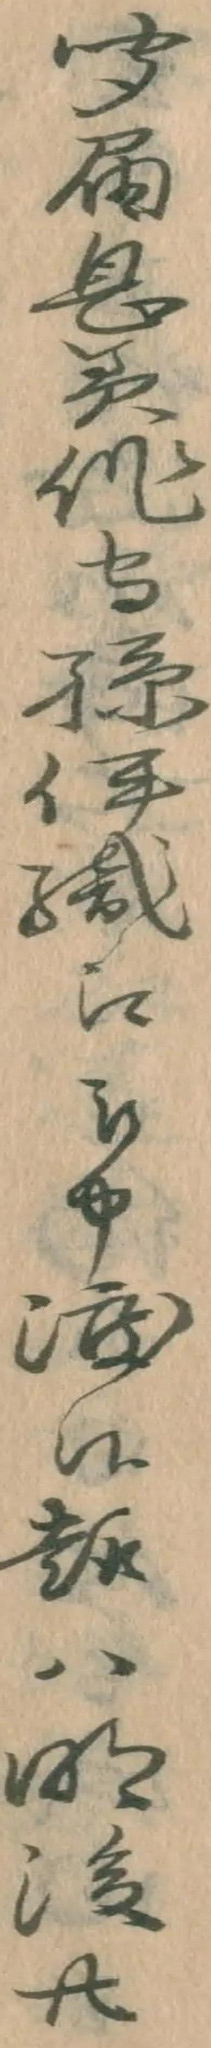聞届息美作守孫伊織江被申渡候趣は明後廿
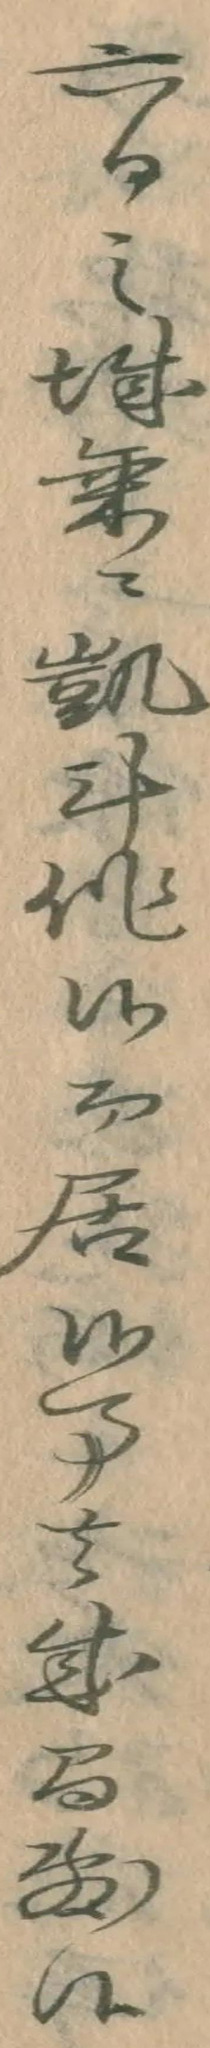六日之城乗に凱斗作候而居候事者成間敷候
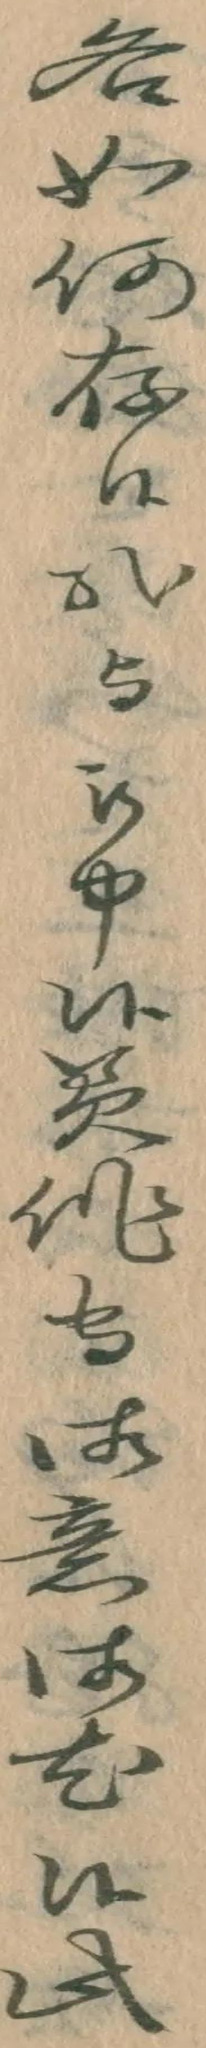各如何存候哉与被申候美作守御意御尤候此
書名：切支丹御退治記 49巻. [7]
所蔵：国立国会図書館 National Diet Library, JAPAN
